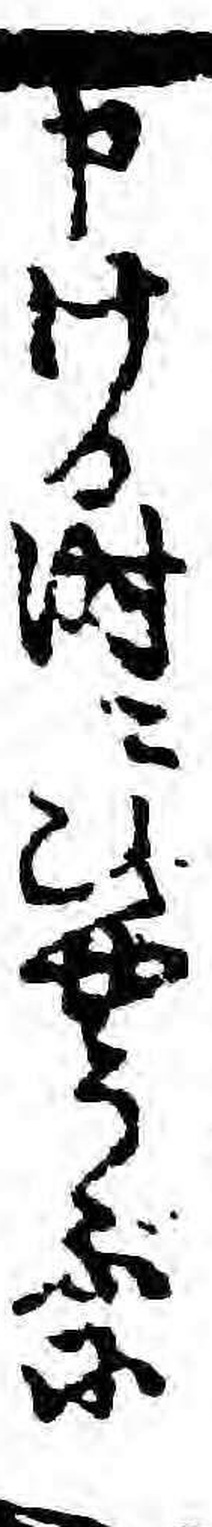申ける時にびやうぶに
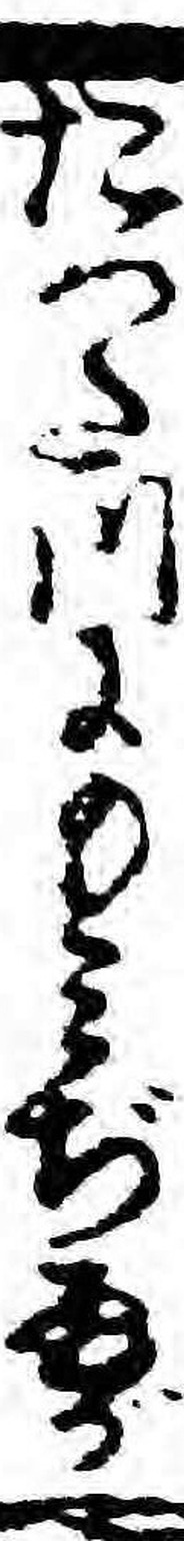たつた川にもみぢなが
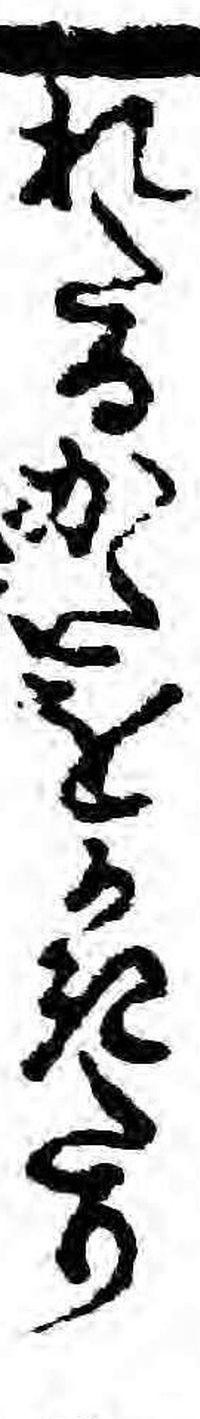れたるかたをかきたり
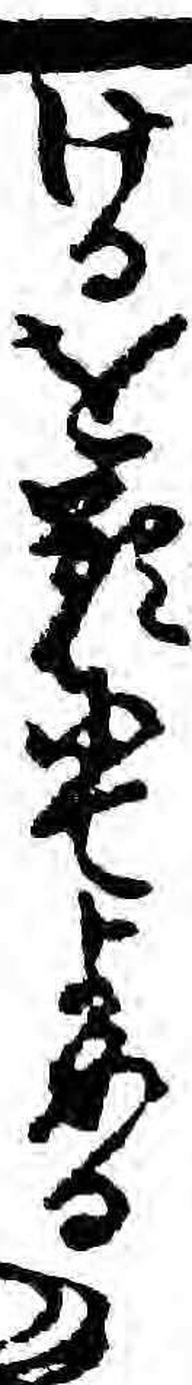けるを題にてよめる
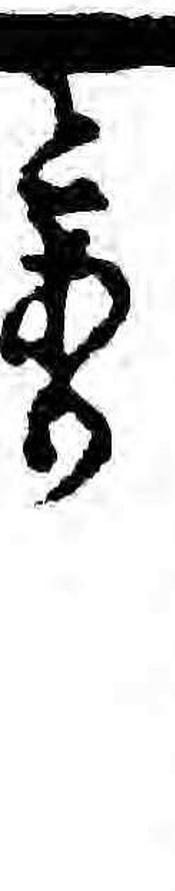とあり
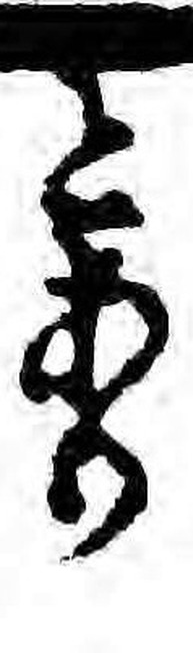とあり
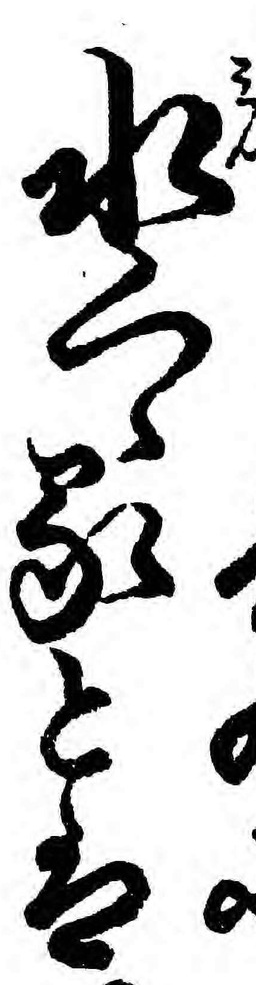水くゝるとは

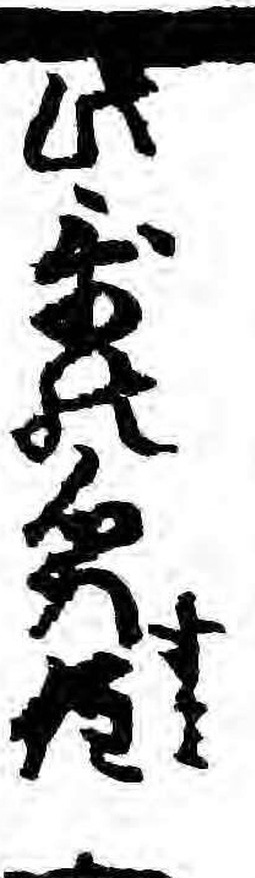此哥の心は住
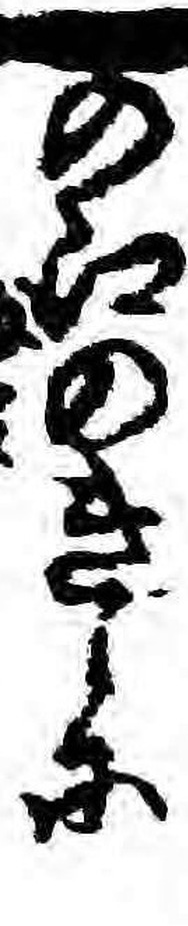の江のきしに
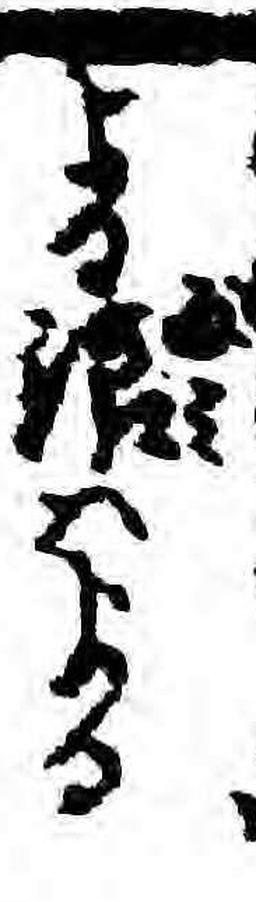よる浪はよる
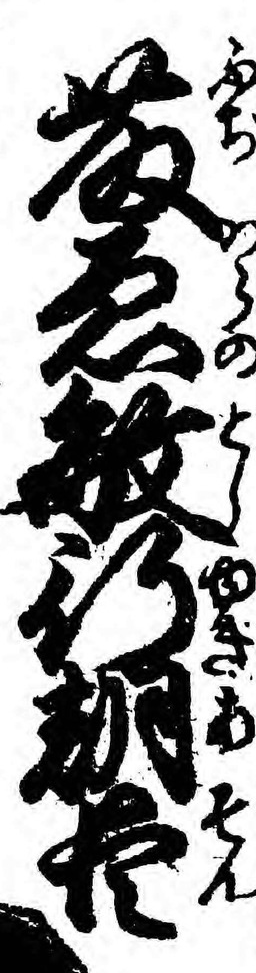藤原敏行朝臣
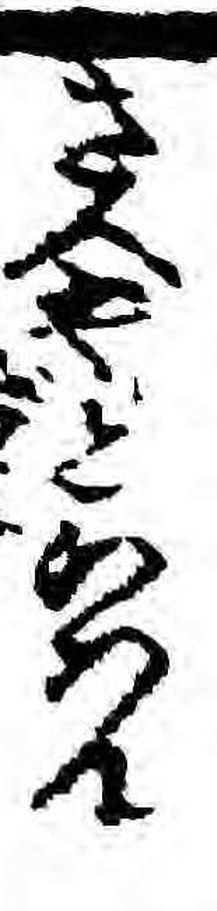さへやといはん
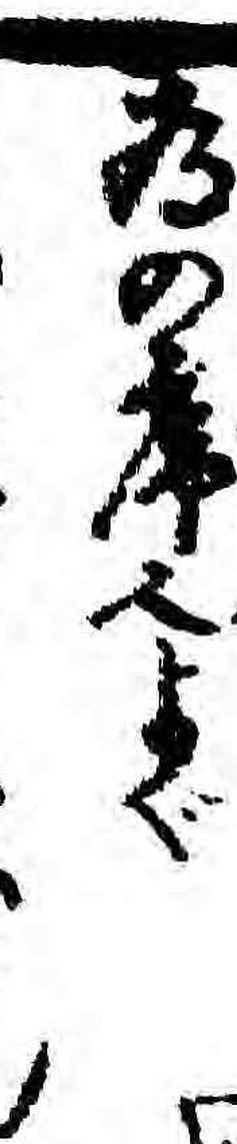為の序也よぐ
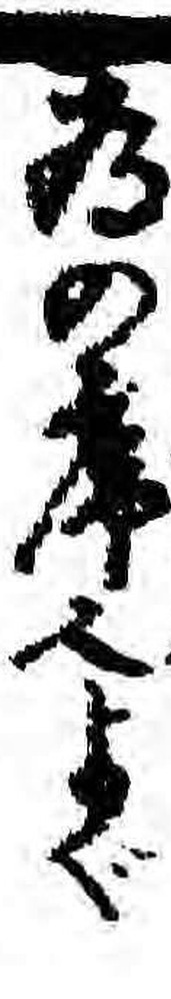為の序也よぐ
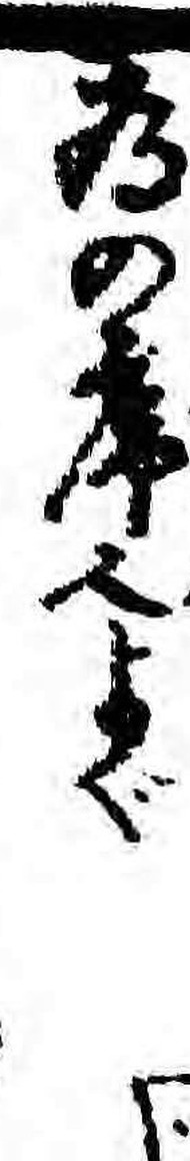為の序也よぐ
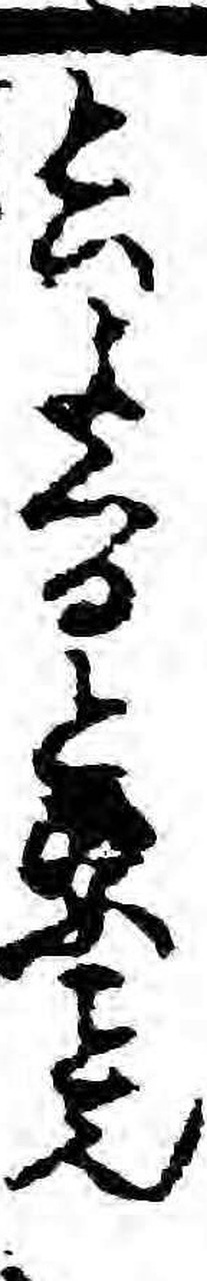とはよくるといふこと也
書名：頭書和歌注譯／壽賀多百人一首小倉錦
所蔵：国文学研究資料館
